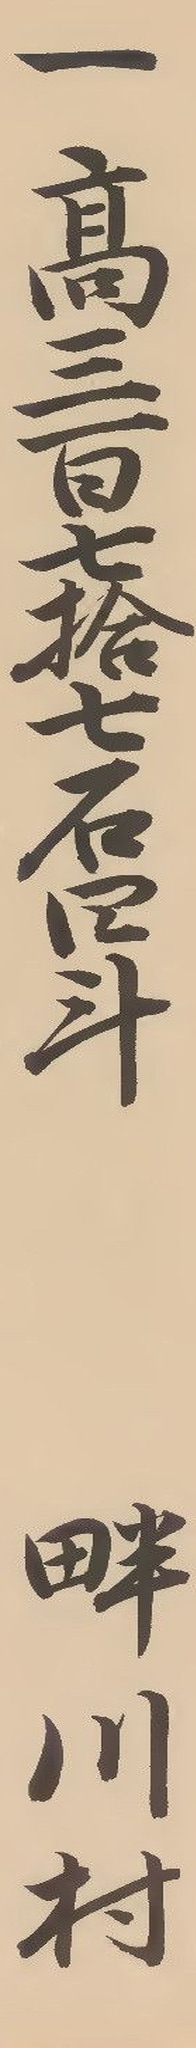一高三百七拾七石四斗畔川村
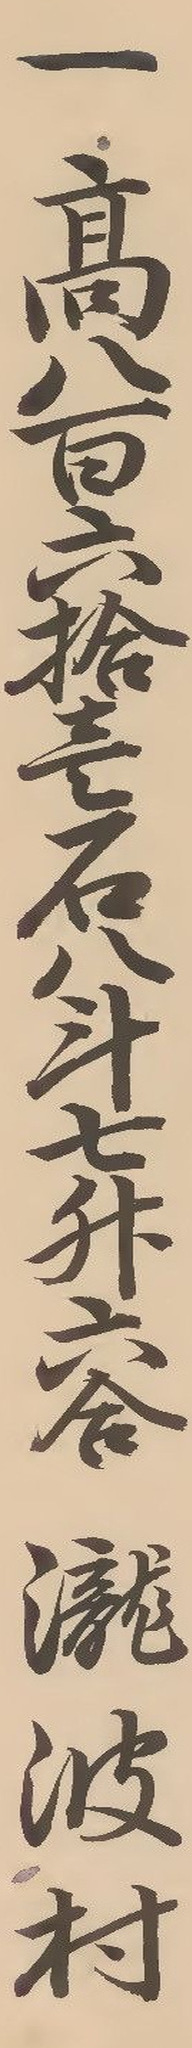一高八百六拾壱石八斗七升六合滝波村

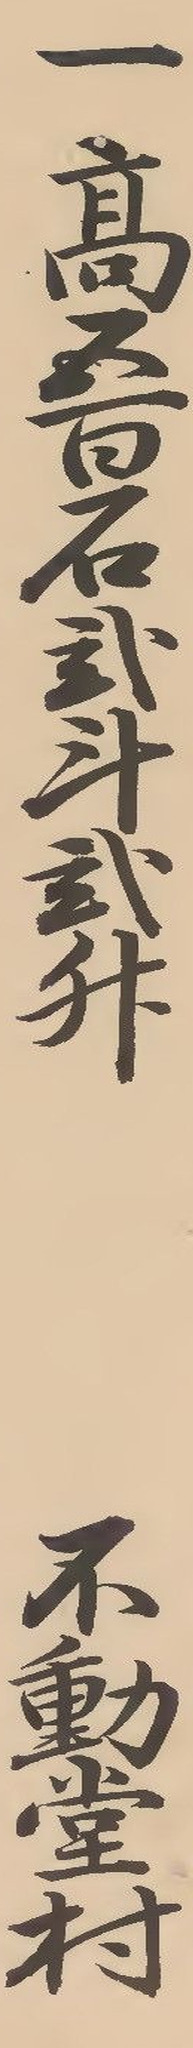一高五百石弐斗弐升不動堂村
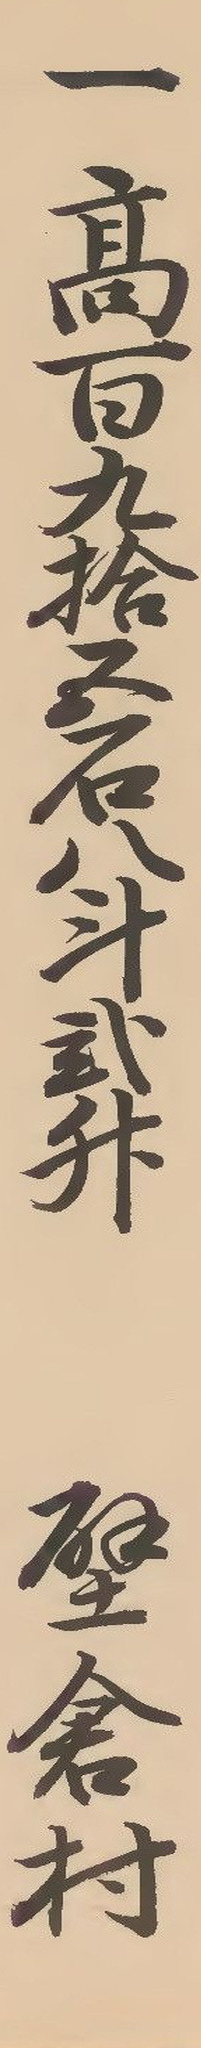一高百九拾五石八斗弐升壁倉村
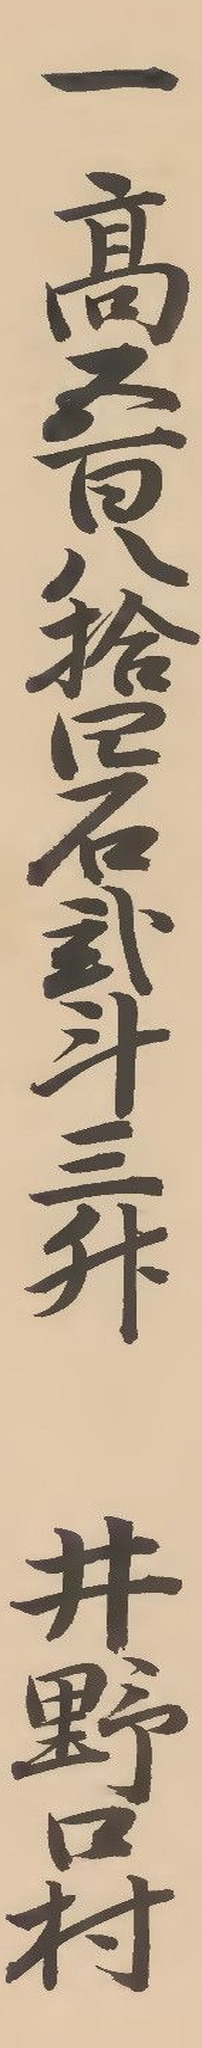一高五百八拾四石弐斗三升井野口村
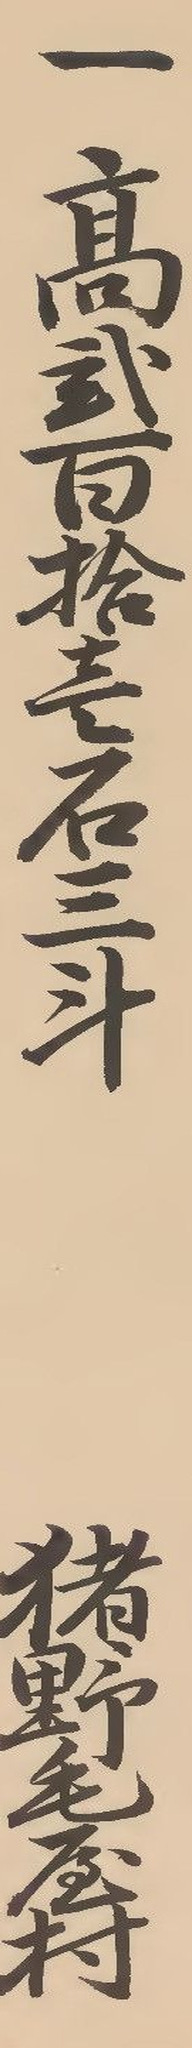一高弐百拾壱石三斗猪野毛屋村
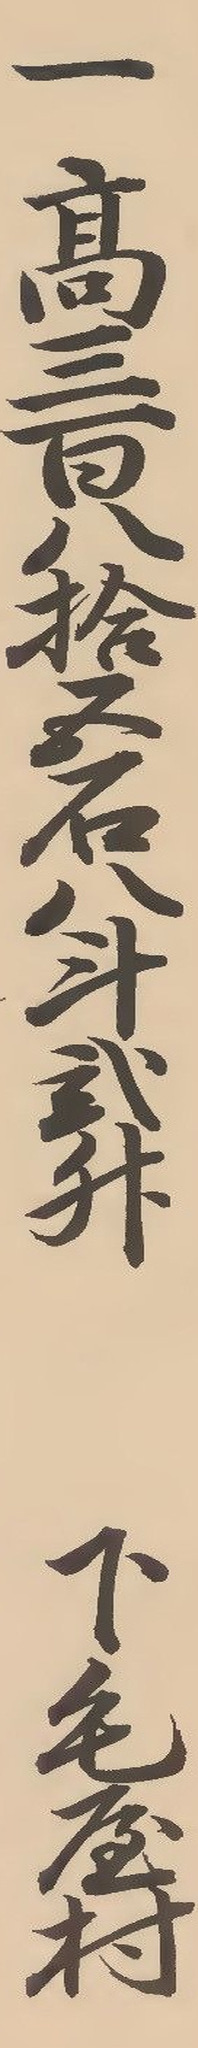一高三百八拾五石八斗弐升下毛屋村
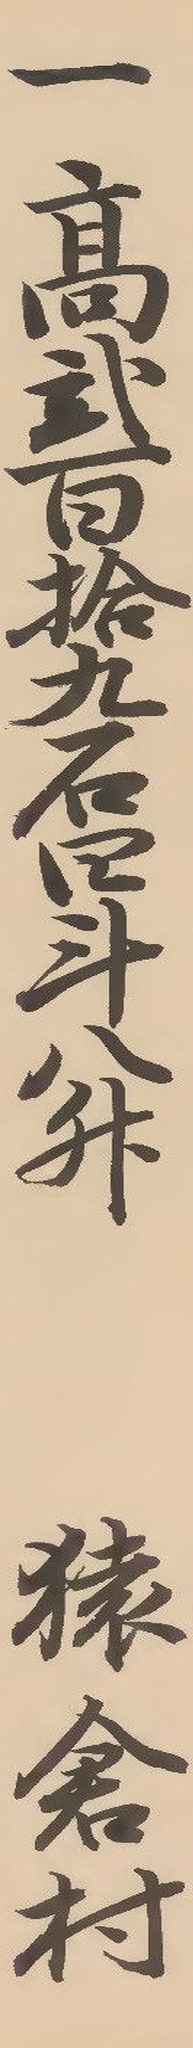一高弐百拾九石四斗八升猿倉村
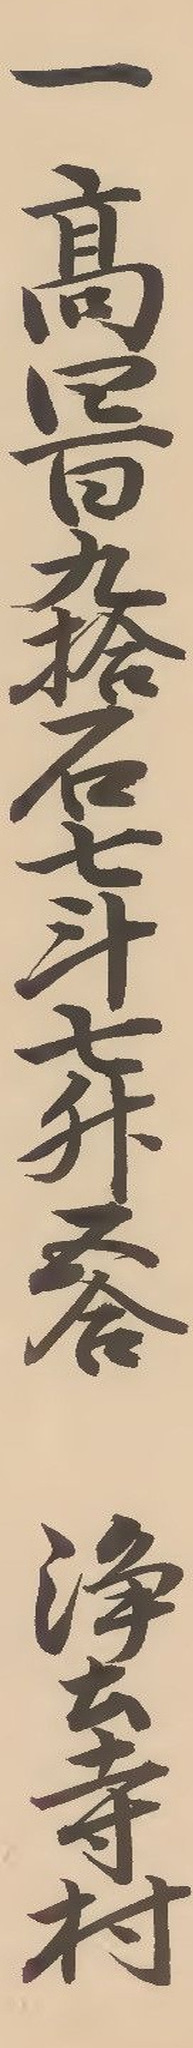一高四百九拾石七斗七升五合浄土寺村
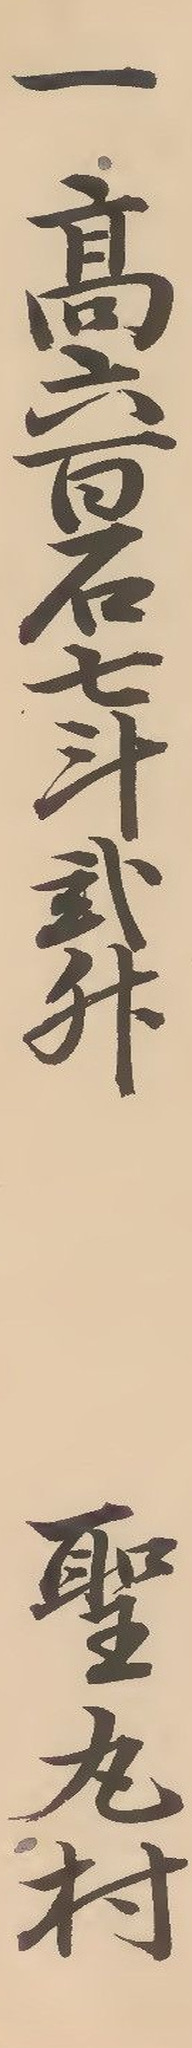一高六百石七斗弐升聖丸村

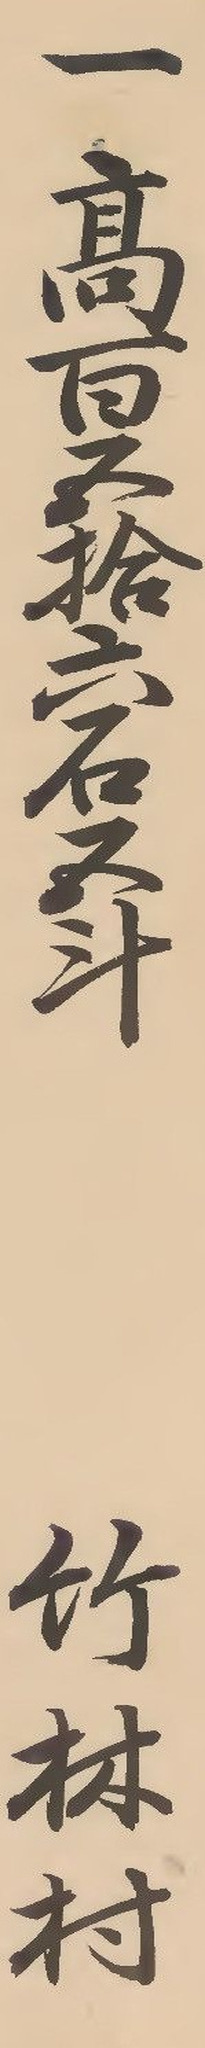一高百五拾六石五斗竹林村
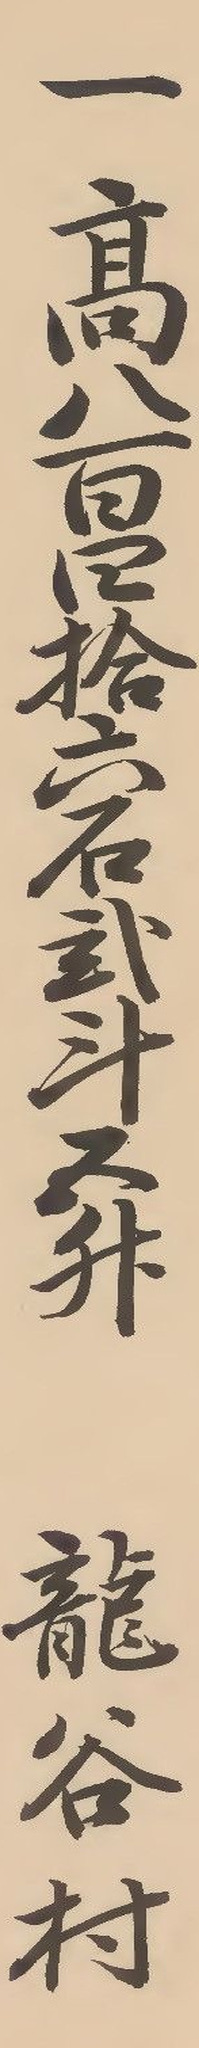一高八百四拾六石弐斗五升竜谷村
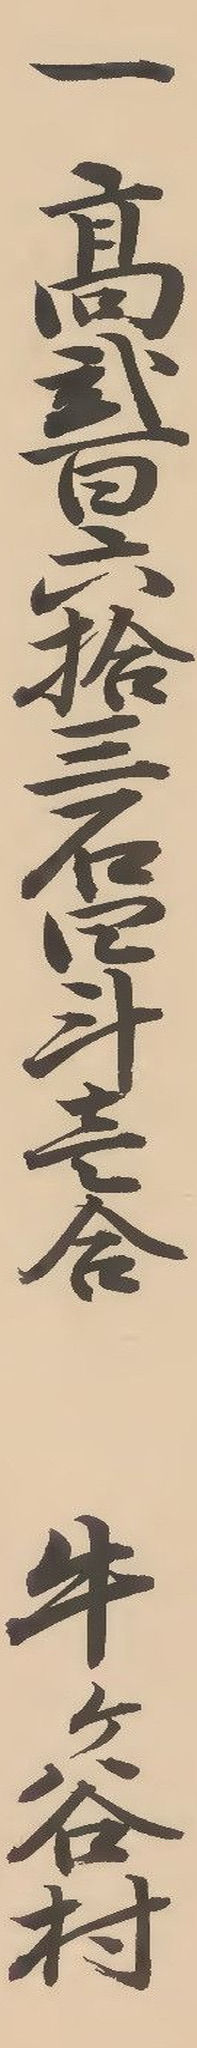一高弐百六拾三石四斗壱合牛ヶ谷村
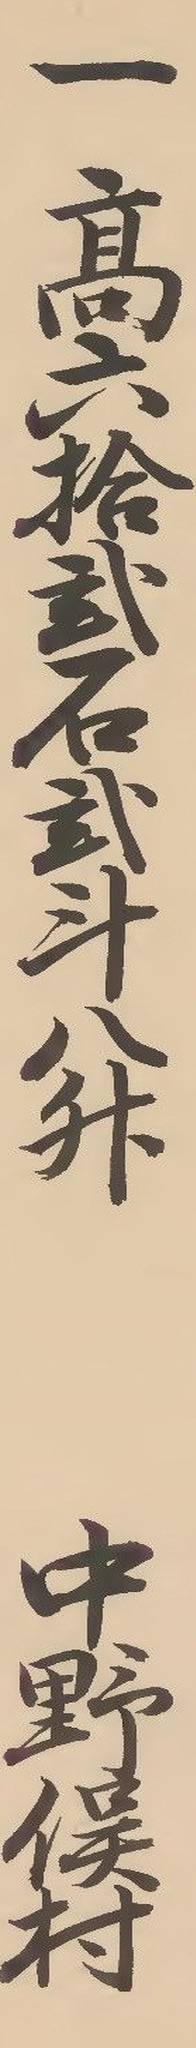一高六拾弐石弐斗八升中野俣村
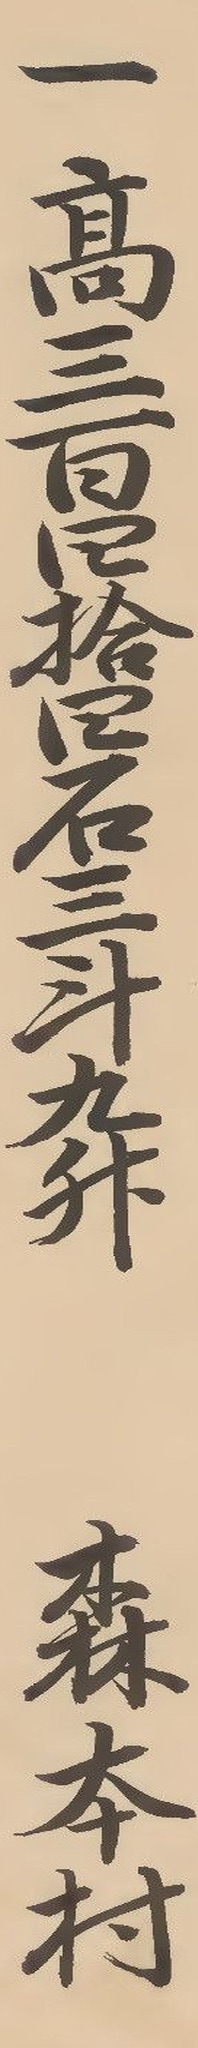一高三百四拾四石三斗九升森本村
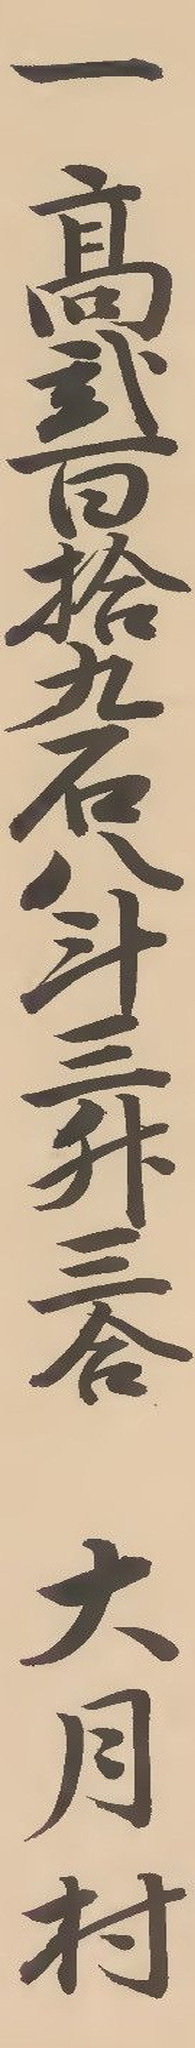一高弐百拾九石八斗三升三合大月村
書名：越前国郷帳
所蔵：国立公文書館 National Archives of Japan
